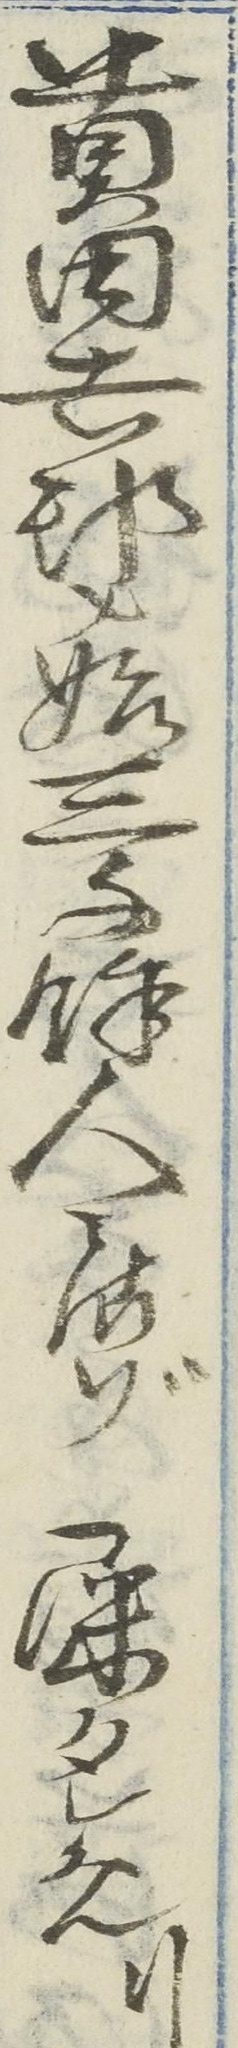貴田吉邨ヲ始三千餘人居ゾ屎タレめ
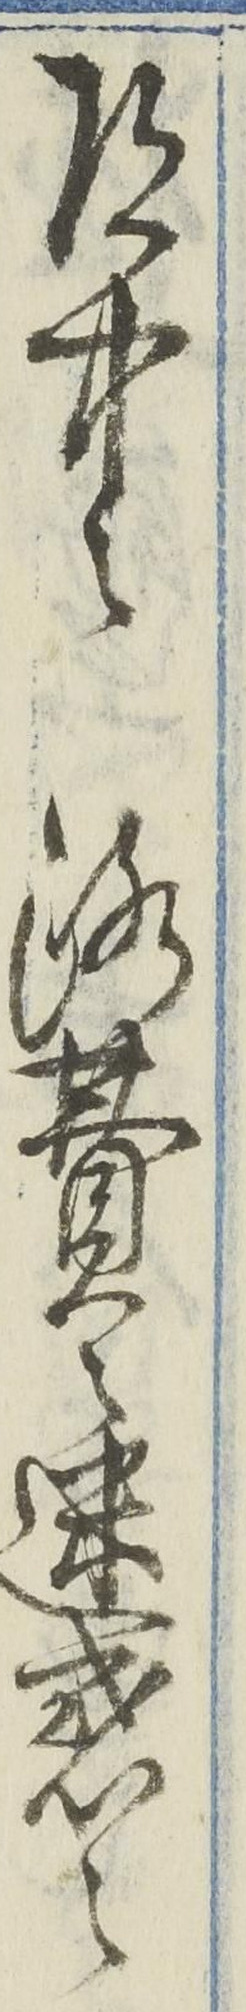道中之路費之迷惑之
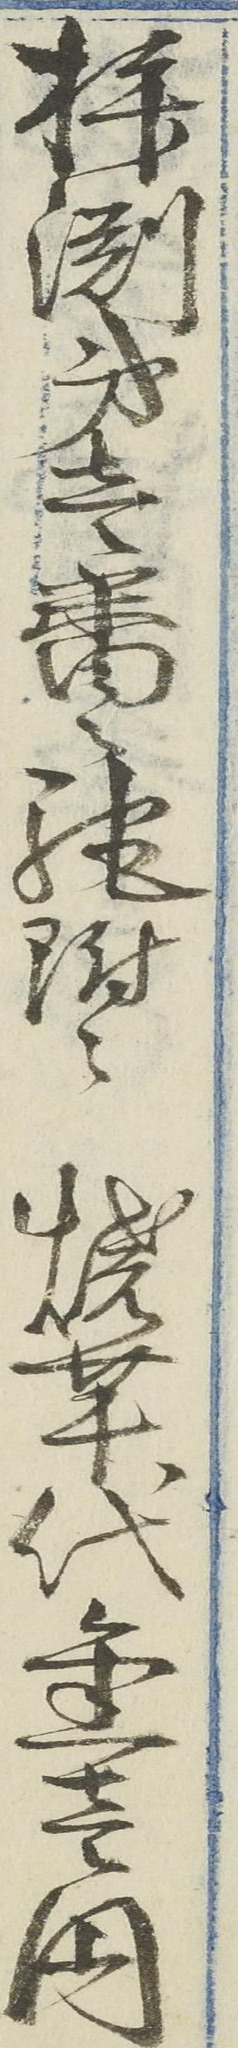杵渕第壱番ニ馳附之焼芋代金壱円
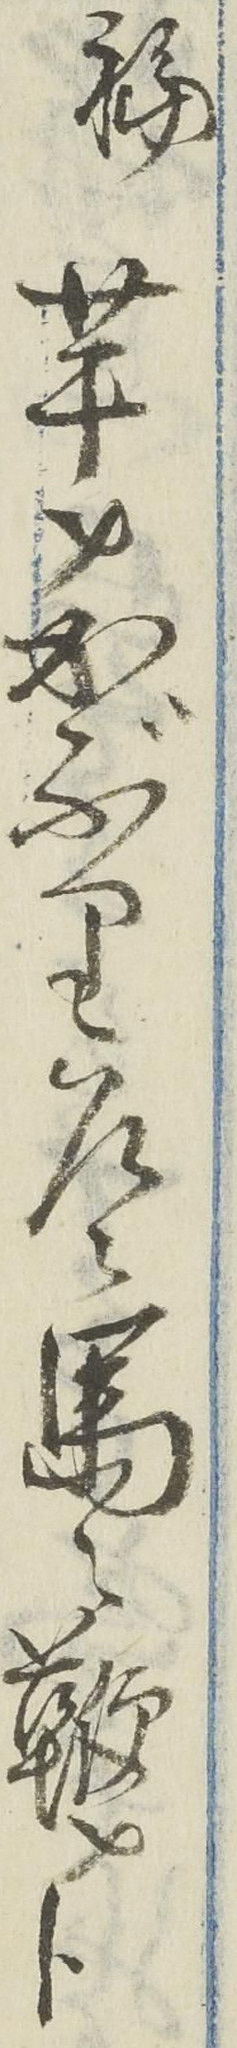福芋ヲかぶり乍ニ馬ニ鞭ヲト
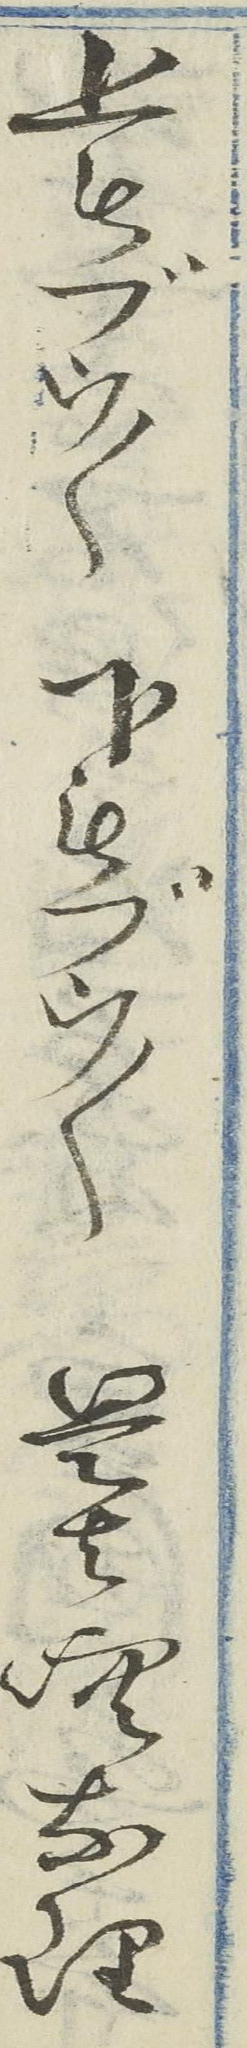上モブウ〳〵下モブウ〳〵是ハ啌なり
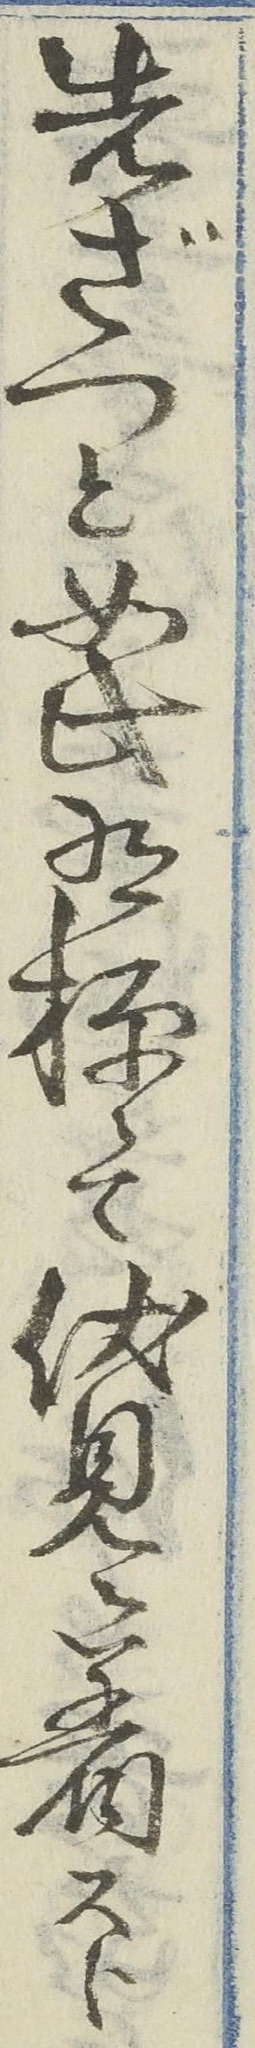先ざつと如此有様にて伏見ニ着スト
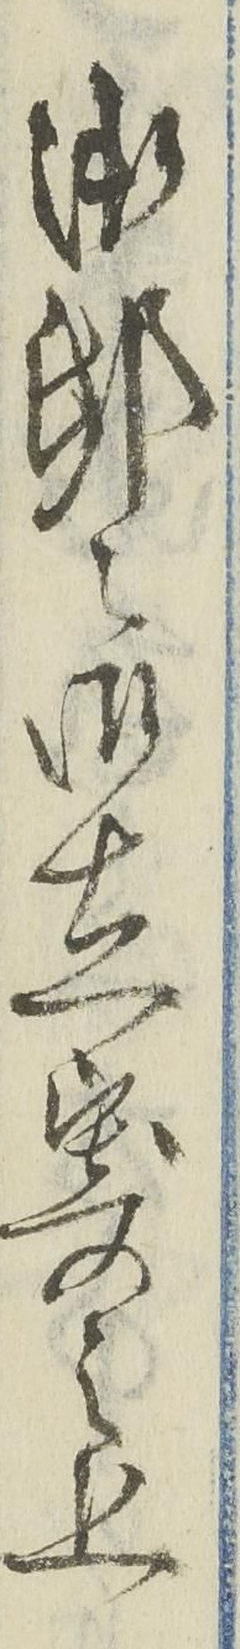臣御邸ニ御立寄之上

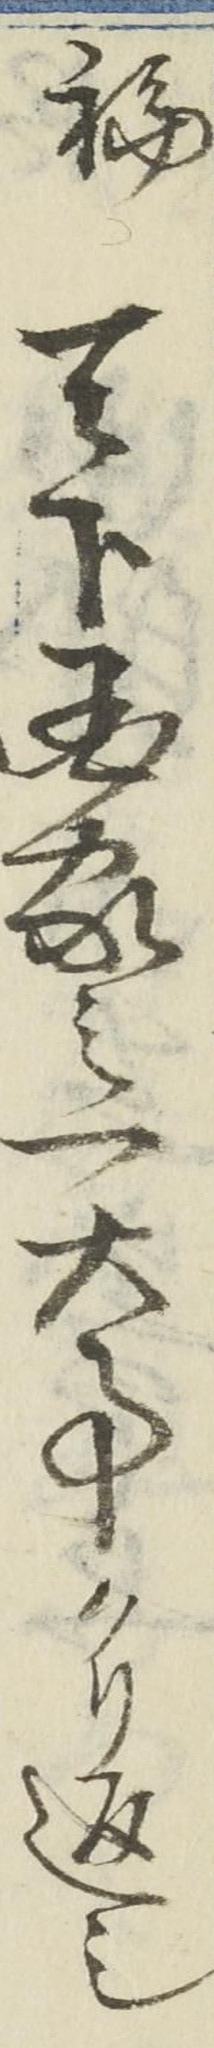福天下国家之一大事クリ返シ
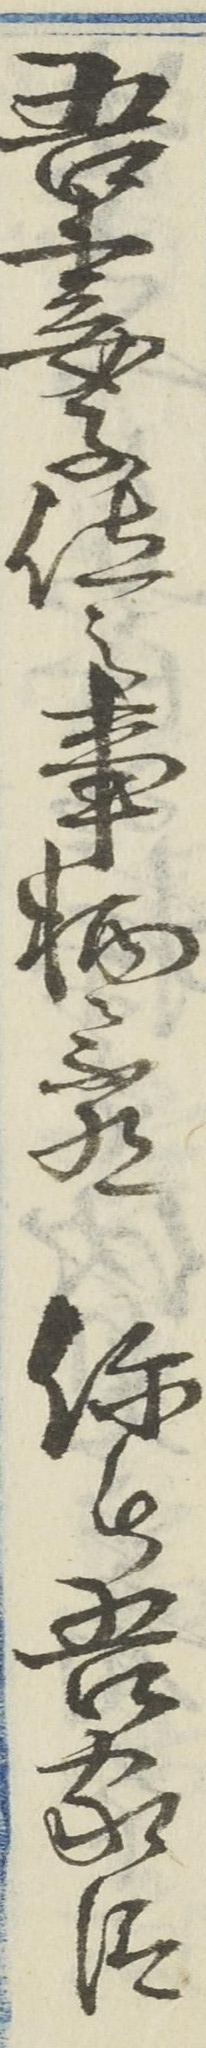吾妻子位之事柄ニ不有爾モ吾家臣
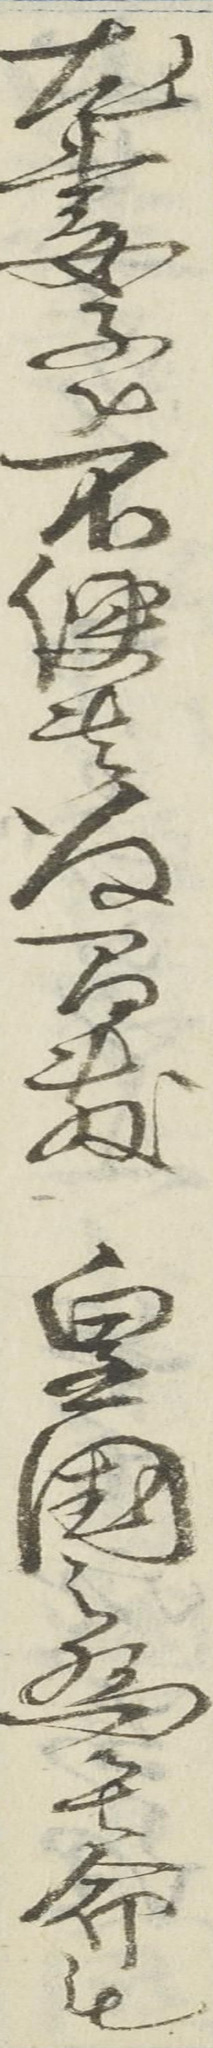尤妻子ヲ不便共存間敷皇国之為ニ者命モ
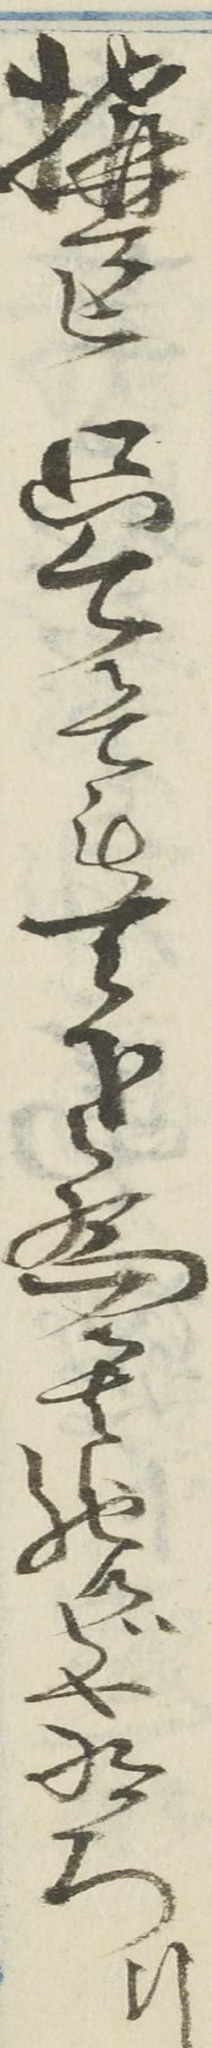構マヒ只今ニテモ天下之為ニ者馳ルジヤ有ろ哉
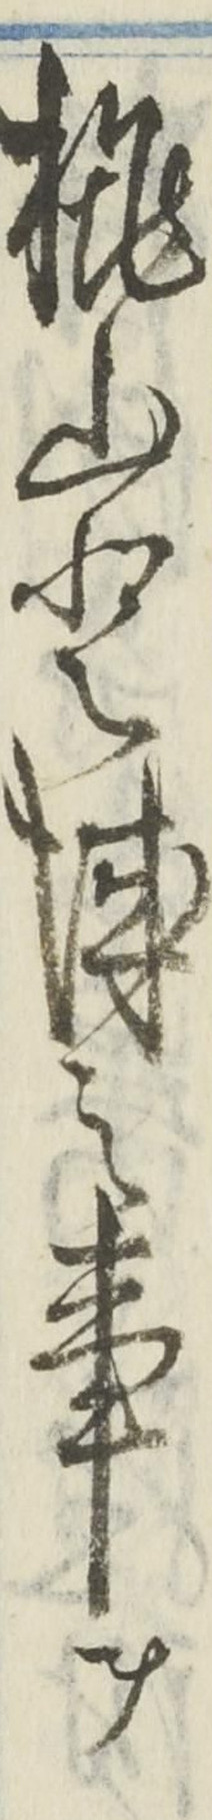桃山登城之事ヲ
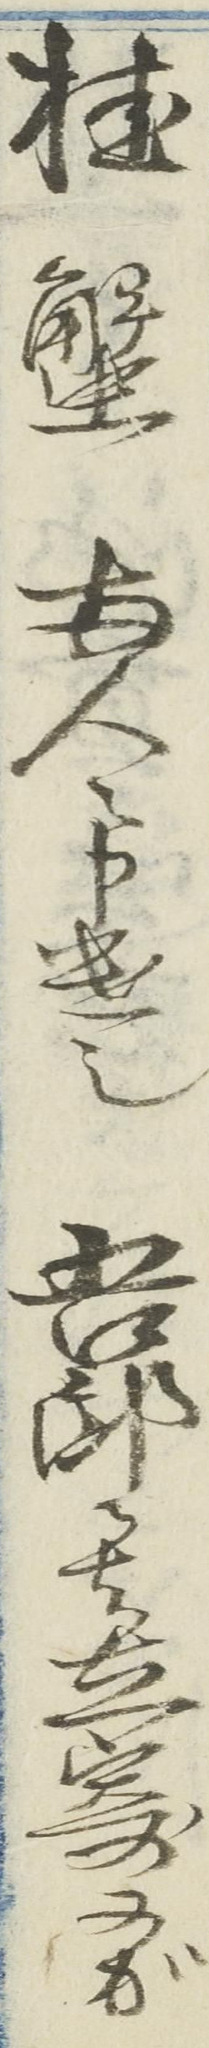桂蟹両人ニ申遣シ吾邸ニ者立寄ヌガ
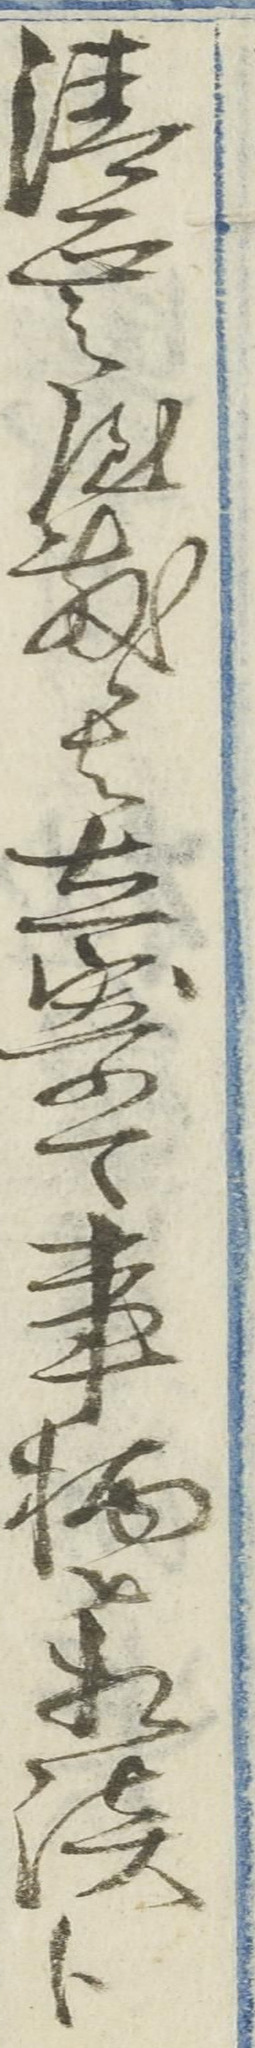清正之屋敷ニ者立寄て事柄ヲ相談ト
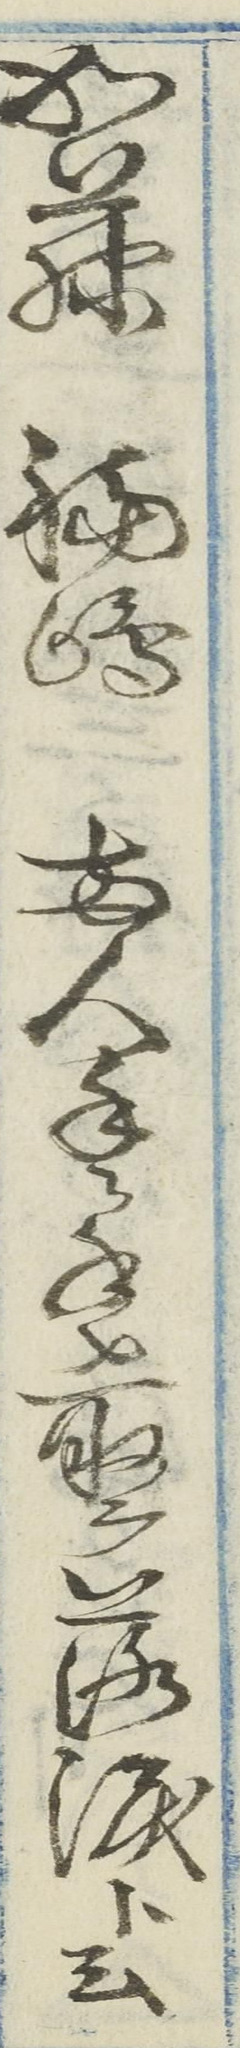加藤福島両人手ニ手ヲ取テ落涙ト云
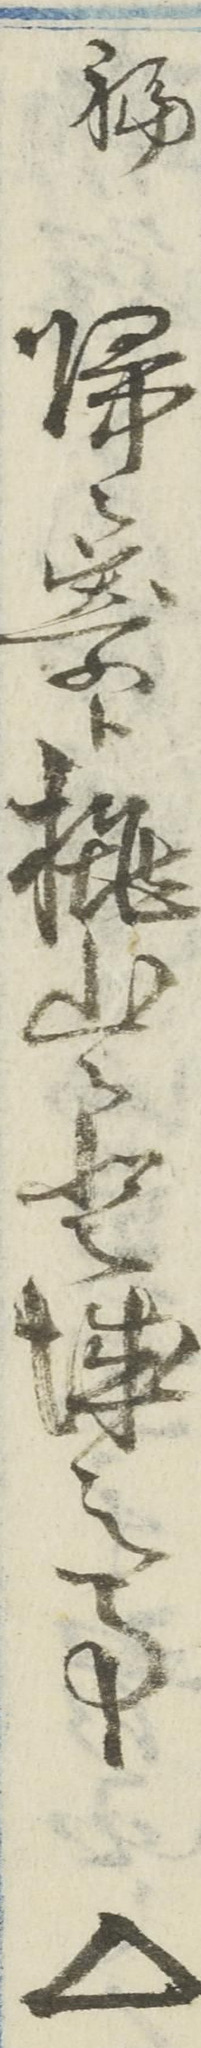福帰ニ寄ト桃山ニ登城之事
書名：伏水大地震
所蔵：東京大学地震研究所図書室 Earthquake Research Institute Library, The University of Tokyo, JAPAN
